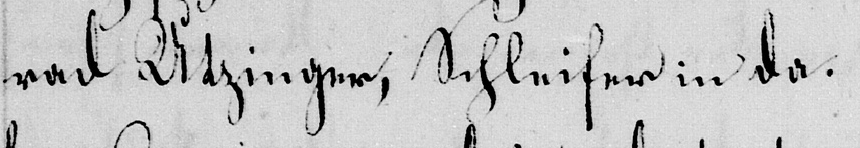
rad Utzinger, Schleifer in da.
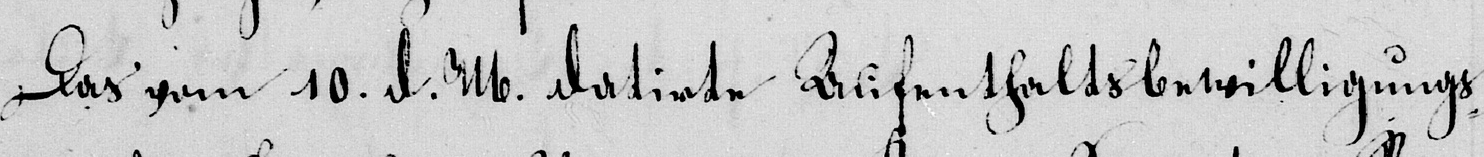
Das vom 10. d. M. datirte Aufenthaltsbewilligungs¬
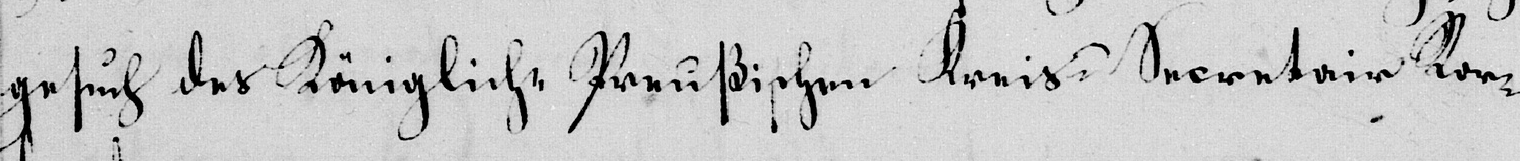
gesuch des Königlich-Preußischen Kreis-Secretaire Ror¬
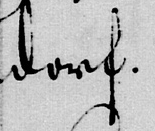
dorf.
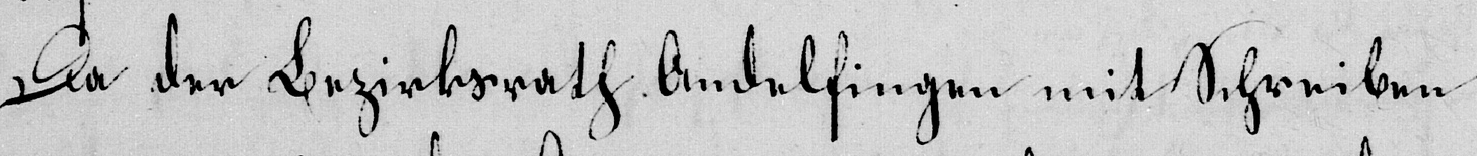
Da der Bezirksrath Andelfingen mit Schreiben
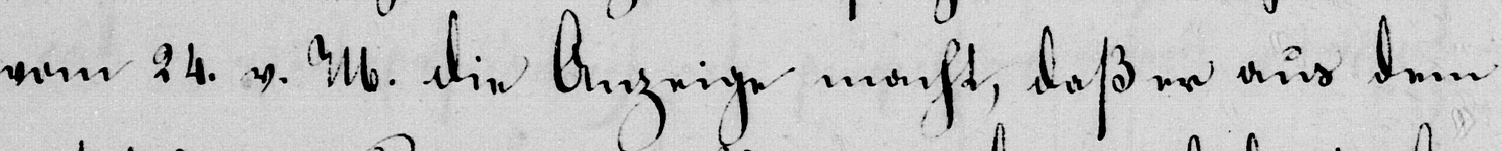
vom 24. v. M. die Anzeige macht, daß er aus dem
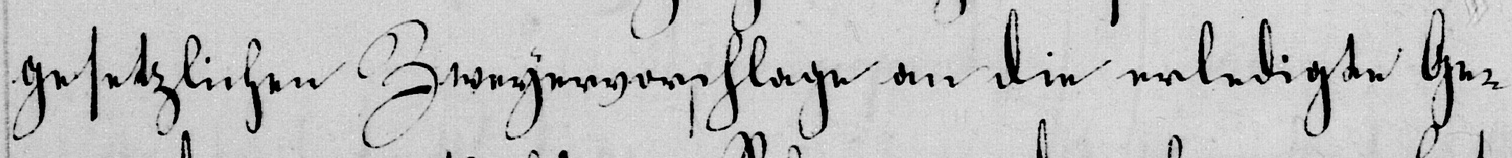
gesetzlichen Zweyervorschlage an die erledigte Ge¬
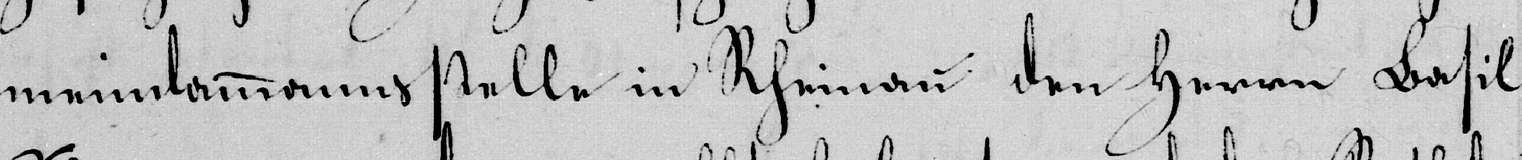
meindammannsstelle in Rheinau den Herrn Basil
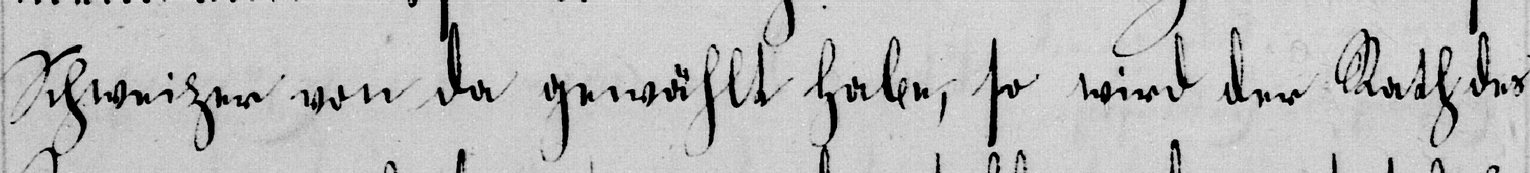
Schweizer von da gewählt habe, so wird der Rath des
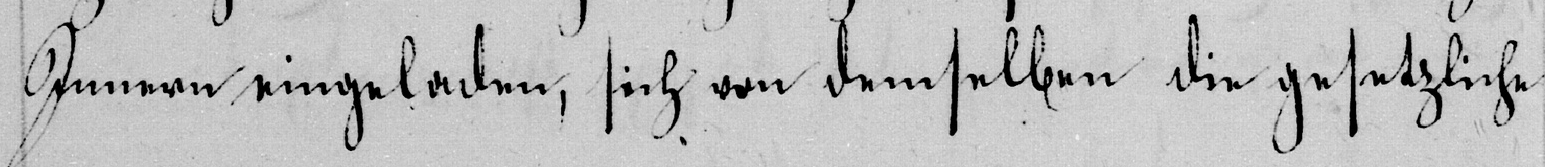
Innern eingeladen, sich von demselben die gesetzliche
